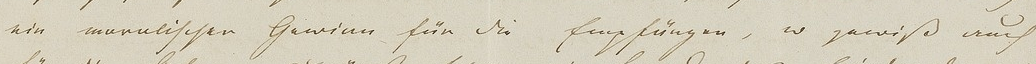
ein moralischer Gewinn für die Empfänger, & gewiß auch
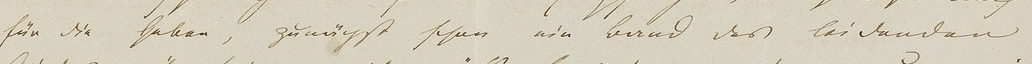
für die Geber, zunächst schon ein Band des leidenden
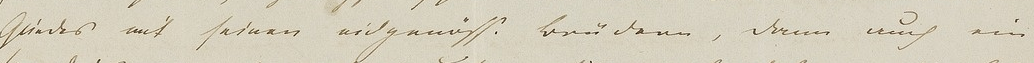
Gliedes mit seinen eidgenöss. Brüdern, dann auch ein
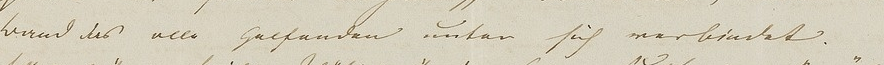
Band das alle Helfenden unter sich verbindet.
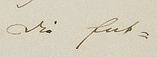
Die Ent-
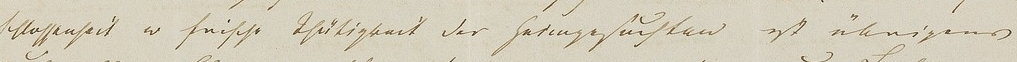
schlossenheit & frische Thätigkeit der Heimgesuchten ist übrigens
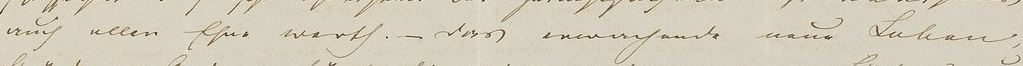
auch aller Ehre werth. – Das erwachende neue Leben,
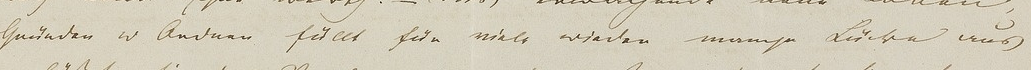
Gründen & Ordnen füllt für viele wieder manche Lücke aus
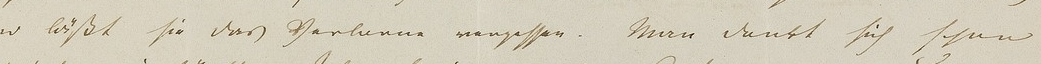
& läßt sie das Verlorne vergessen. Man denkt sich schon
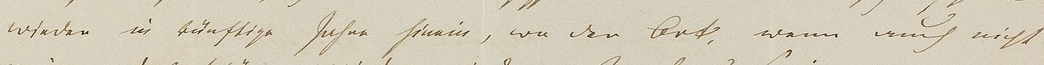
wieder in künftige Jahre hinein, wo der Ort, wenn auch nicht
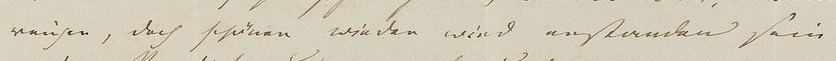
reicher, doch schöner wieder wird erstanden sein.
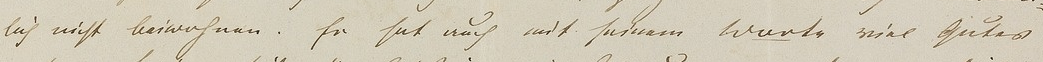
lich nicht beiwohnen. Er hat auch mit seinem Worte viel Gutes
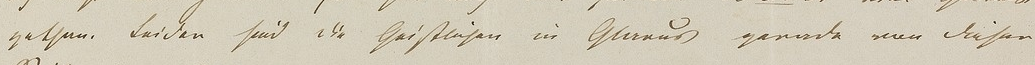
gethan. Leider sind die Geistlichen in Glarus gerade von dieser
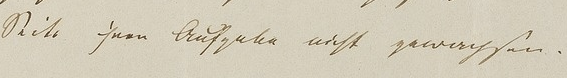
Seite ihrer Aufgabe nicht gewachsen.
